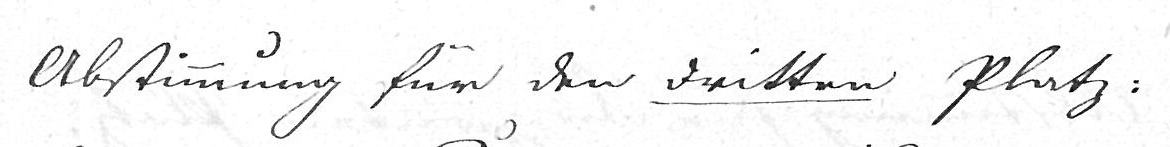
Abstimmung für den dritten Platz:
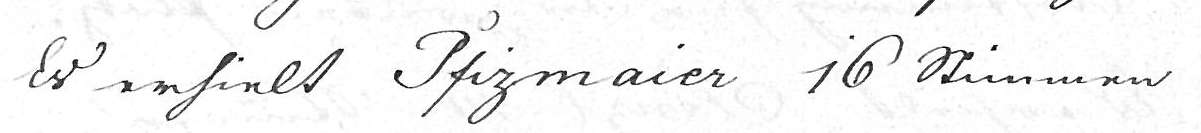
Es erhielt Ptizmaier 16 Stimmen
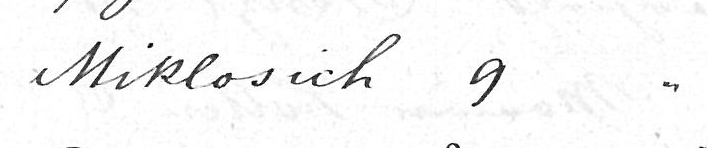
Mikolsich 9 "
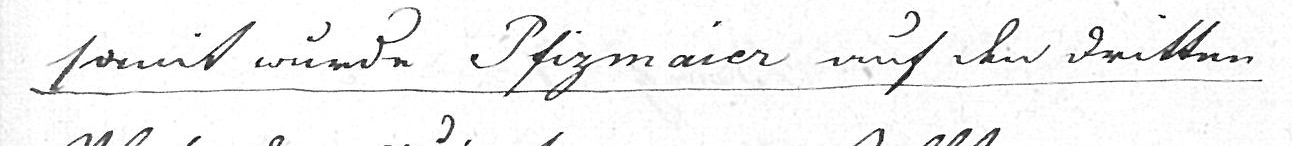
somit wurden Pfizmaier auf den dritten
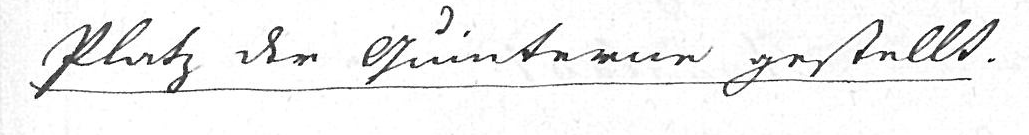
Platz der Quinterne gestellt.
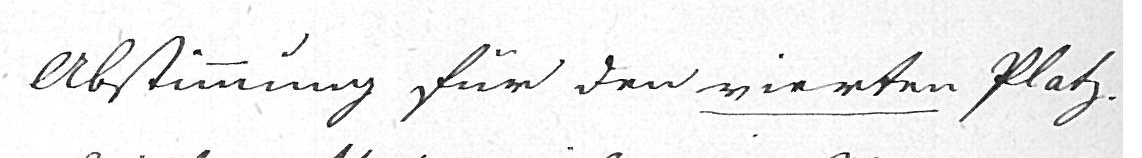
Abstimmugn für den vierten Platz.
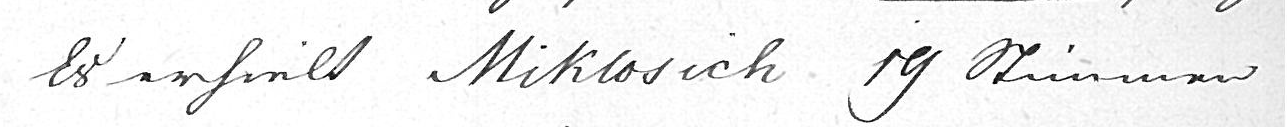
Es erhielt Miklosich 19 Stimmen
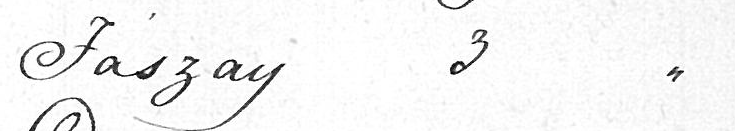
Jászay 3 "
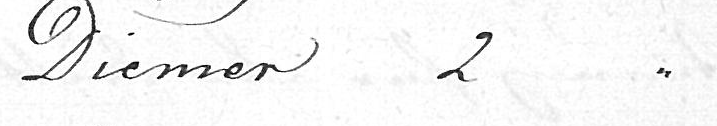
Diemer 2 "
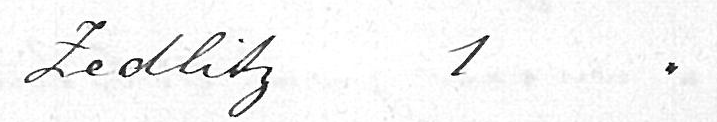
Zedlitz 1 "
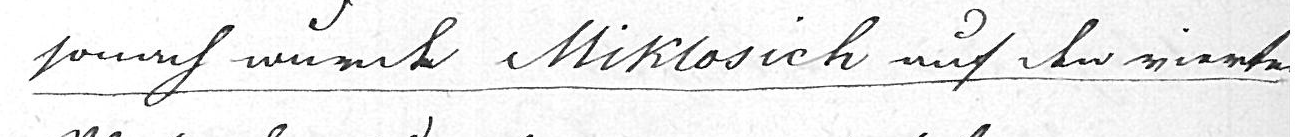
sonach wurde Mikolsich auf den vierte
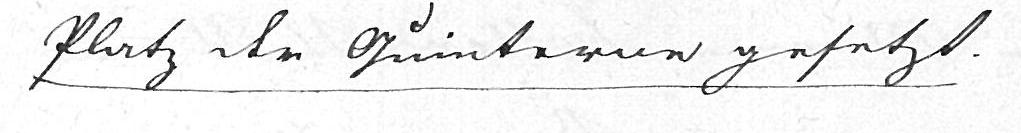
Platz der Quinterne gesetzt.
